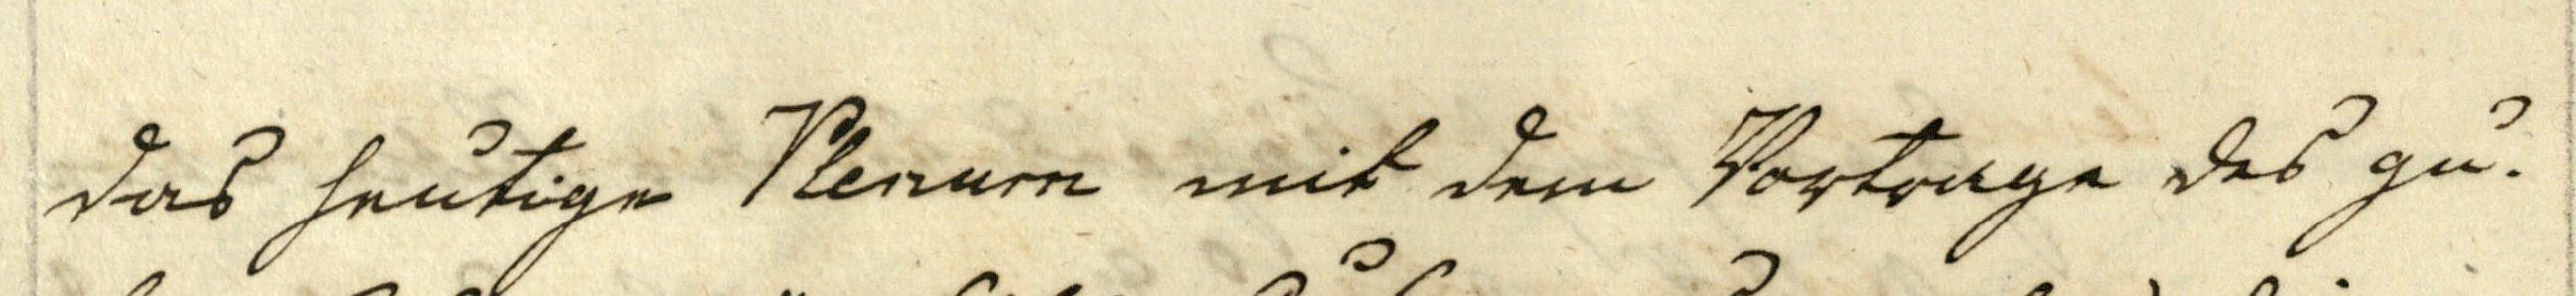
das heutige Plenum mit dem Vortrage des gu¬
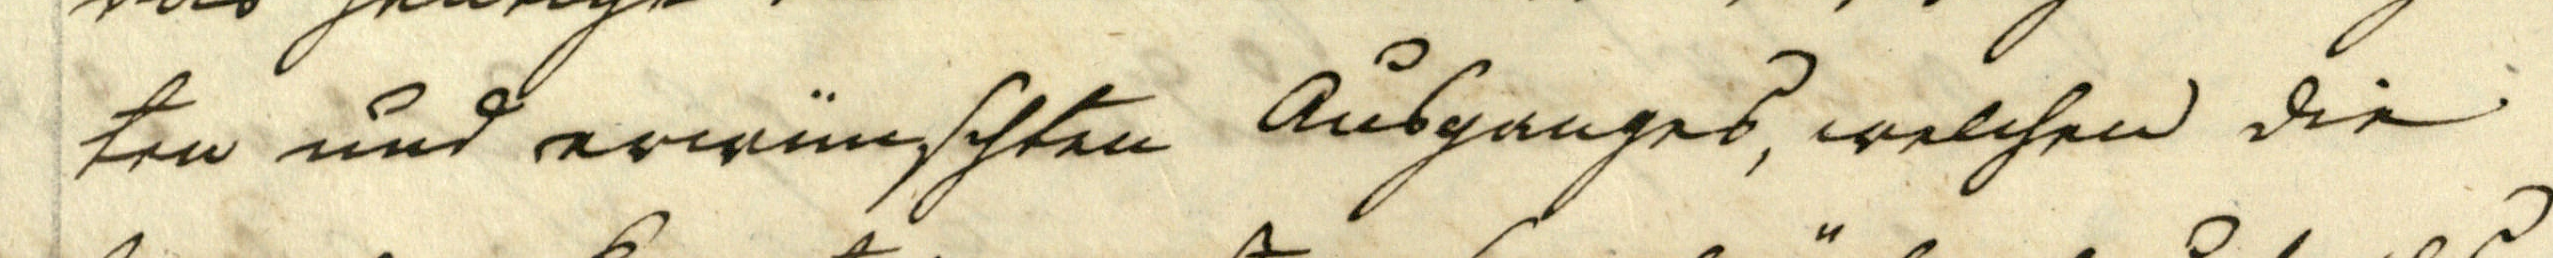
ten und erwünschten Ausganges, welchen die
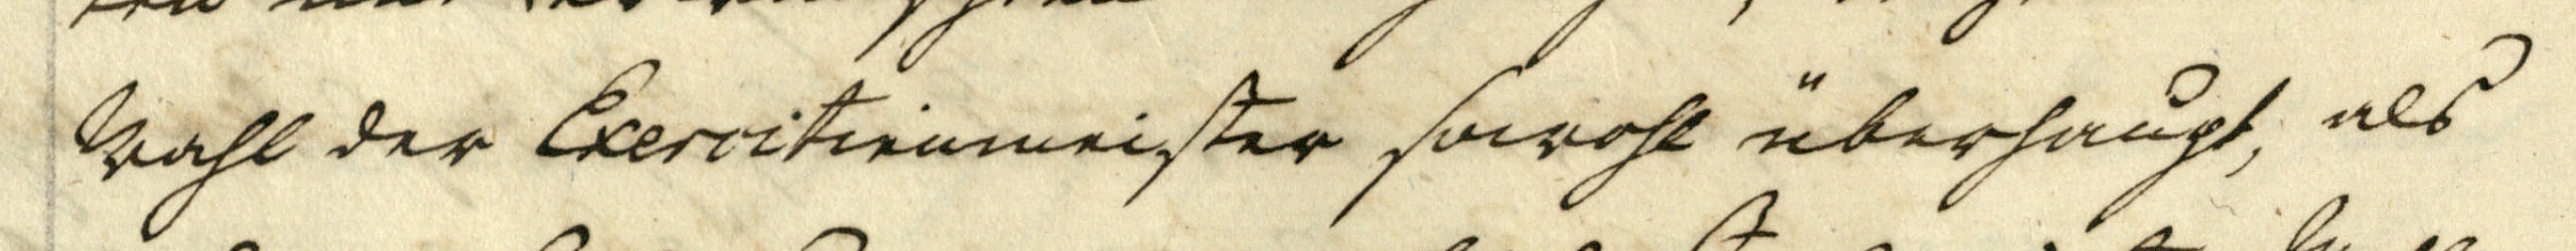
Wahl der Exercitienmeister sowohl überhaupt, als
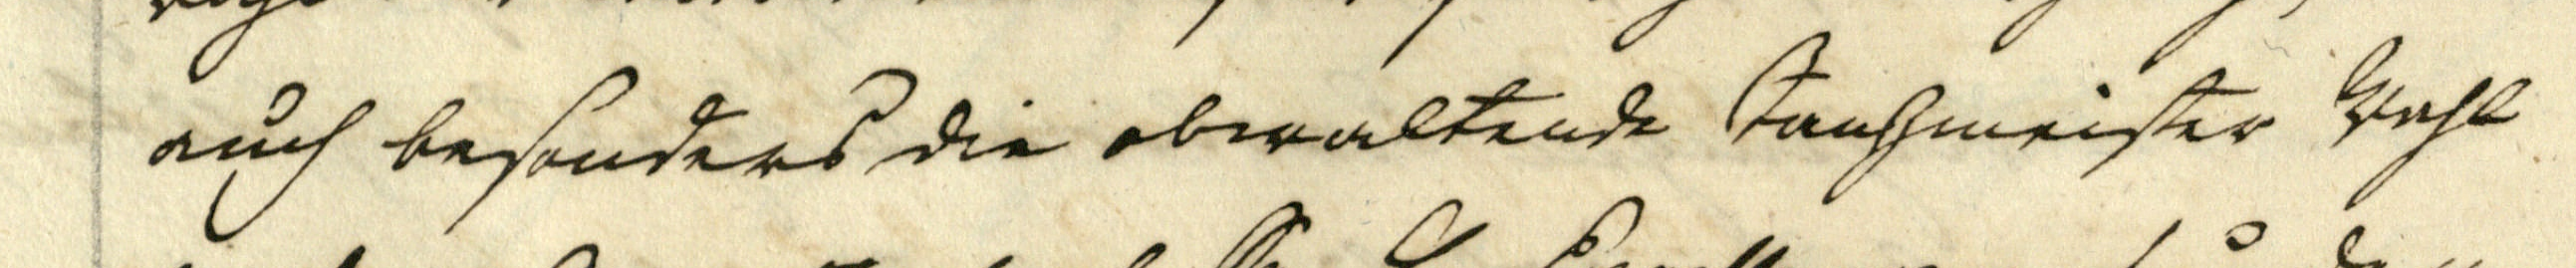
auch besonders die obwaltende Tanzmeister Wahl
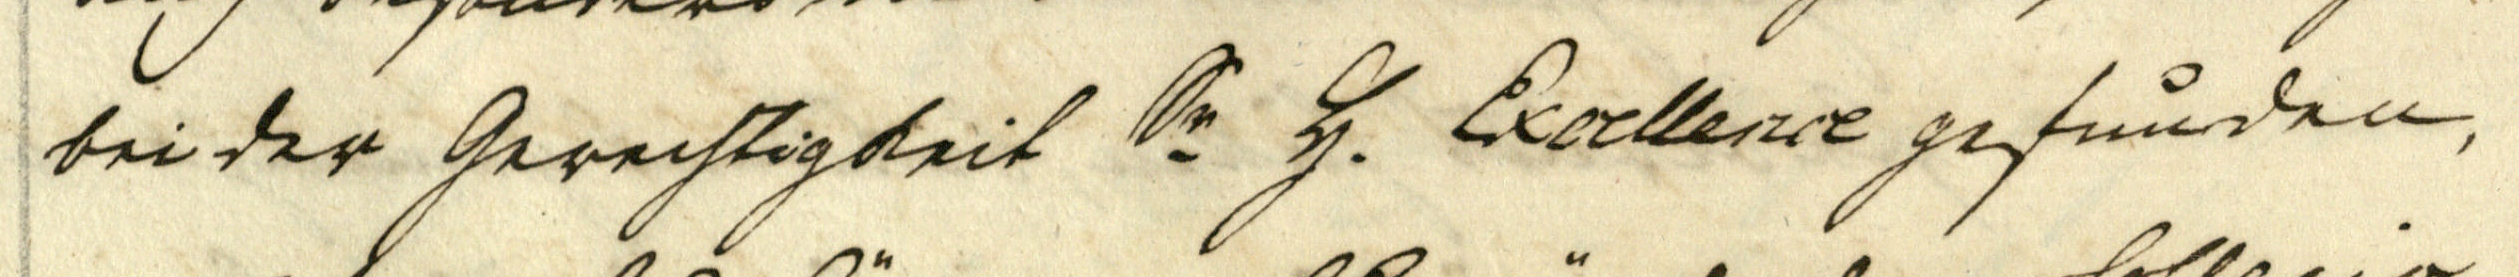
bei der Gerechtgkeit Sr H. Excellence gefunden,
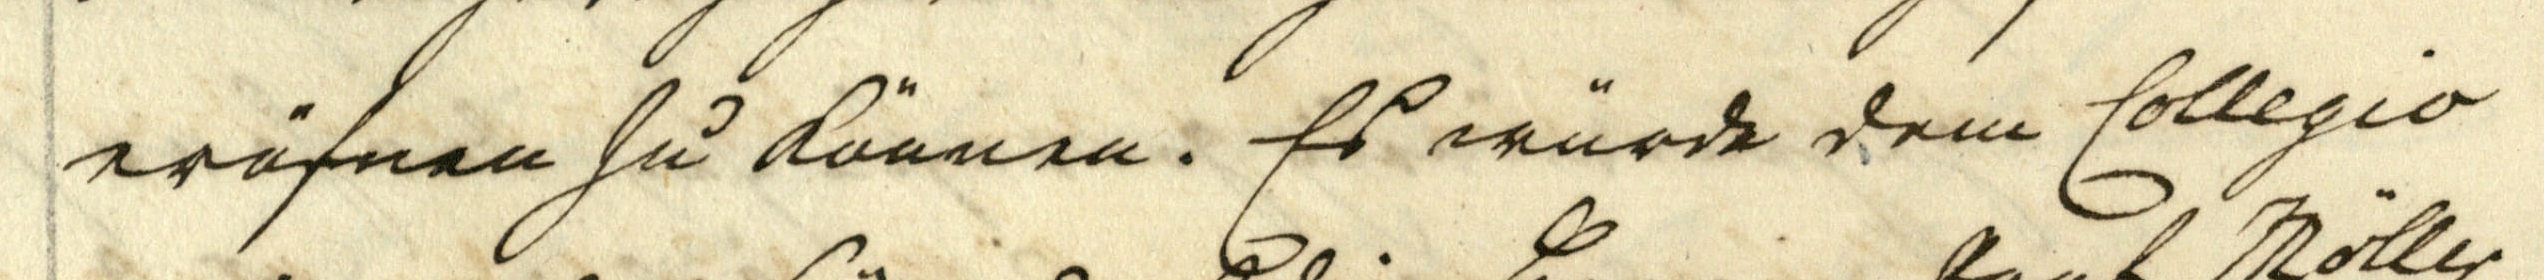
eröfnen zu können. Es würde dem Collegio
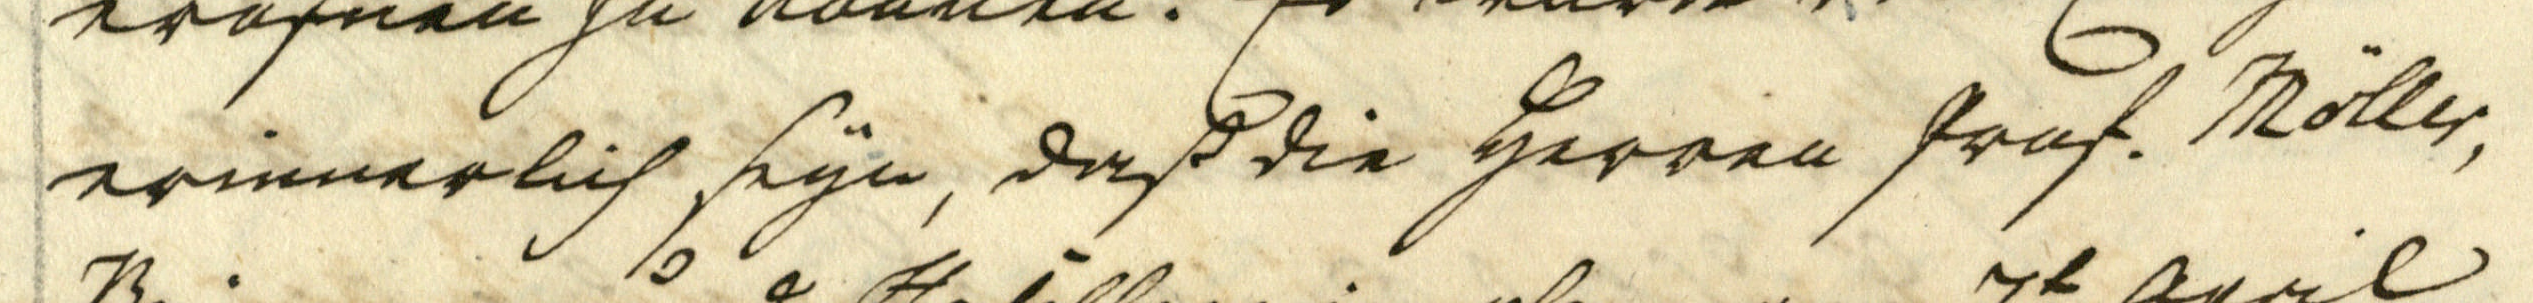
erinnerlich seÿn, daß die Herren Prof. Möller,
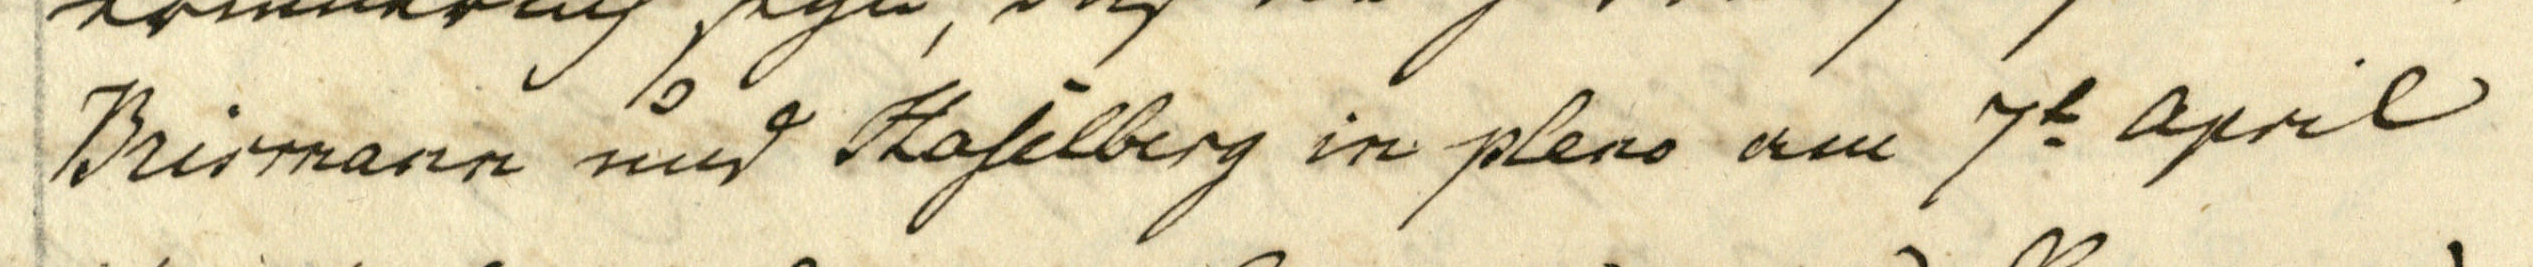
Brismann und Haselberg in pleno am 7 te April
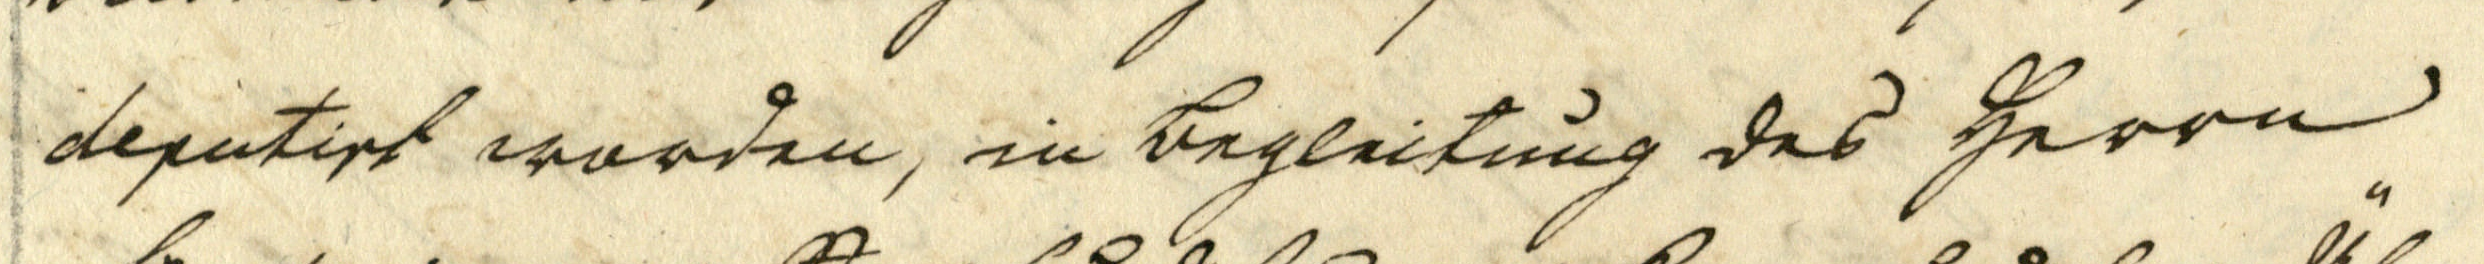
deputiert worden, in Begleitung des Herrn
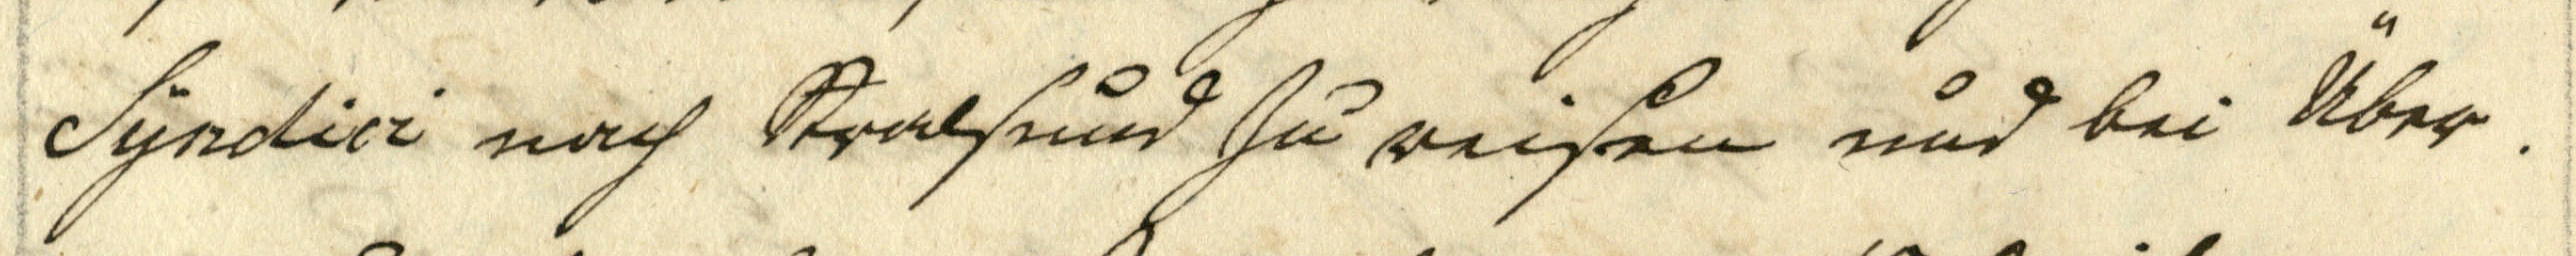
Sÿndici nach Stralsund zu reisen und bei Über¬
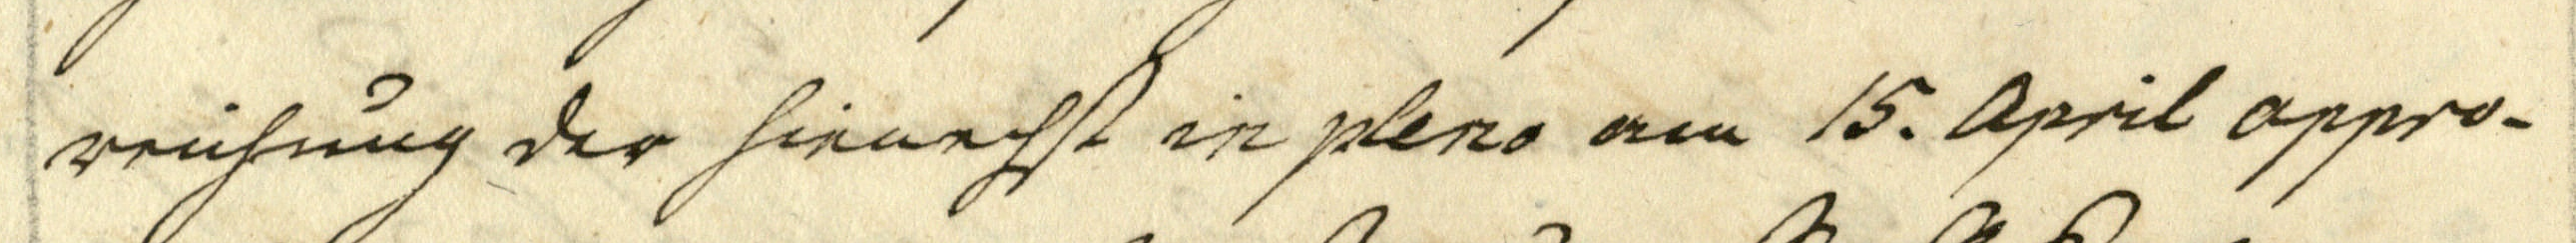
reichung der hienechst in pleno am 15. April appro¬
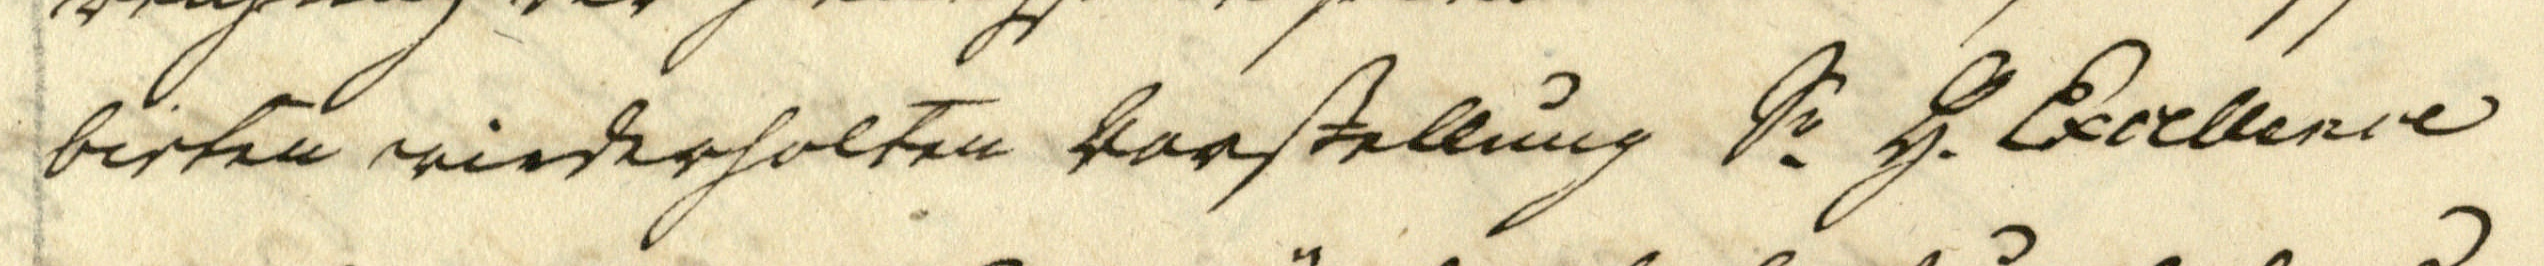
birten wiederholten Vorstellung Sr H. Excellence
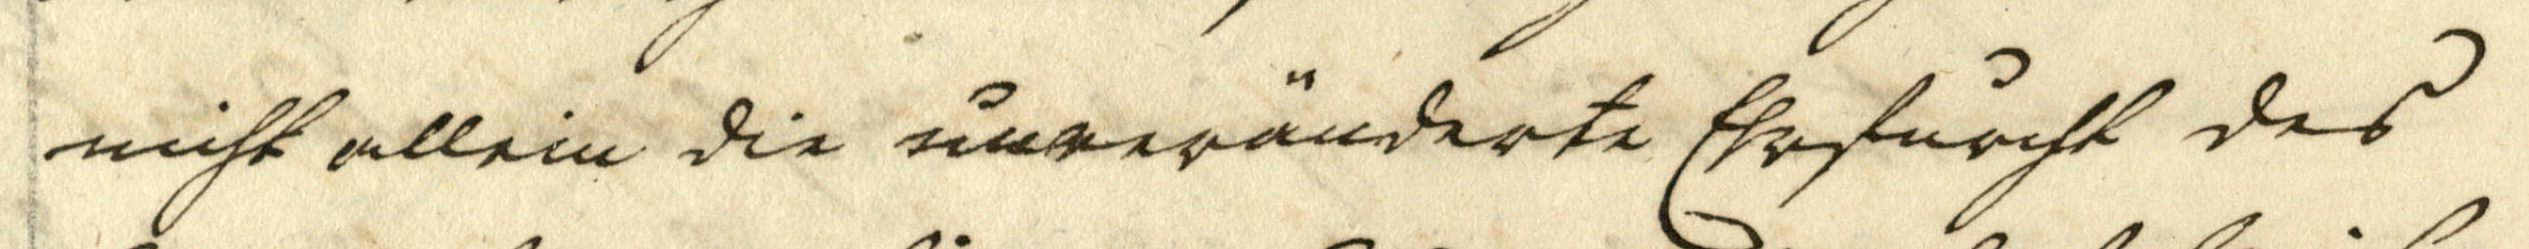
nicht allein die unveränderte Ehrfurcht des
